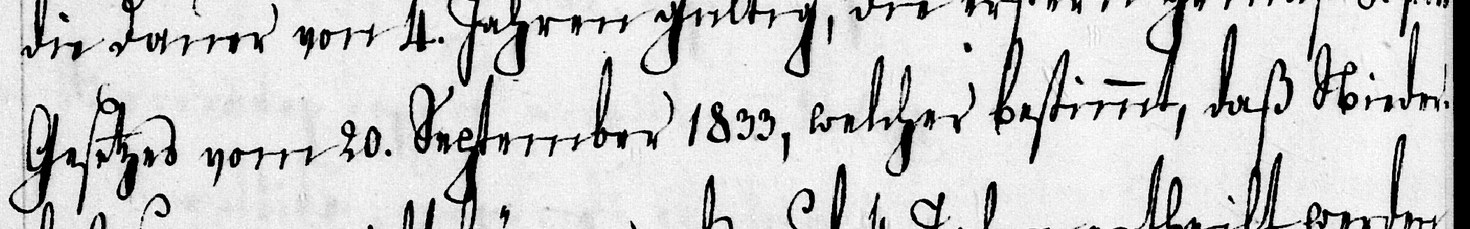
Gesetzes vom 20. September 1833, welcher bestimmt, daß Nieder¬
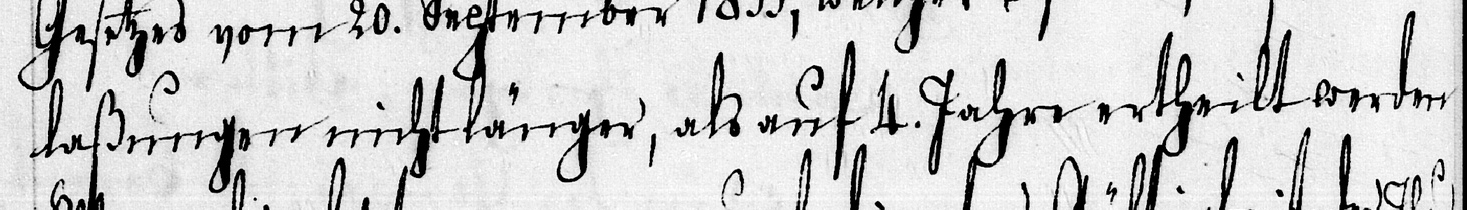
laßungen nicht länger, als auf 4. Jahre ertheilt werden
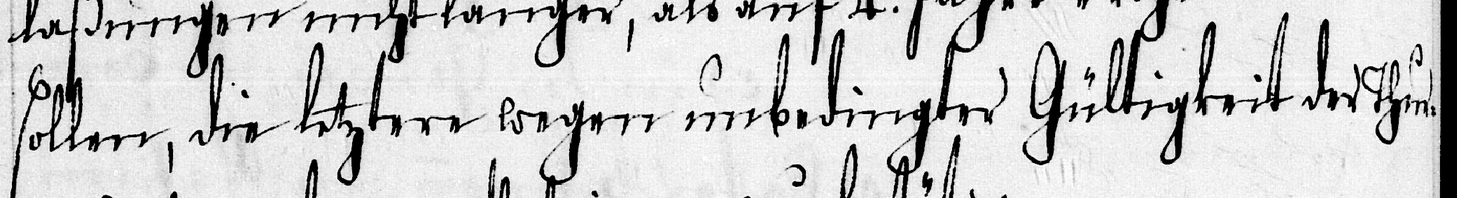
ollen, die letztere wegen unbedingter Gültigkeit der Th¬
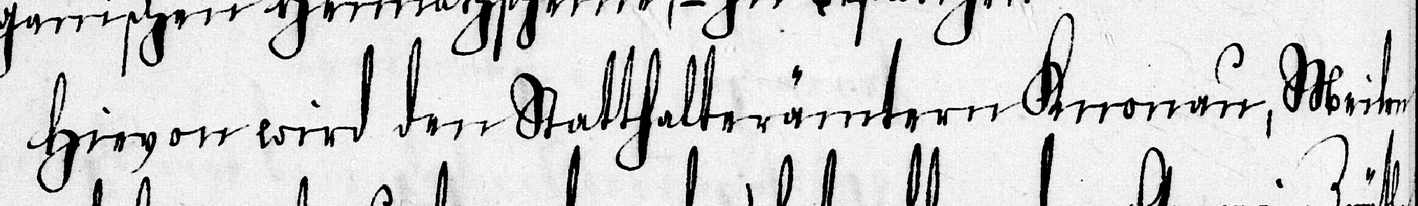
Hievon wird den Statthalterämtern Knonau, Meilen
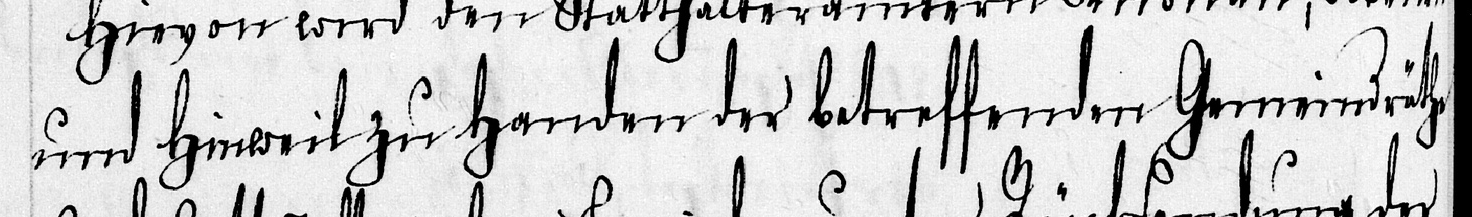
und Hinweil zu Handen der betreffenden Gemeindräthe
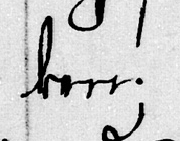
ken.
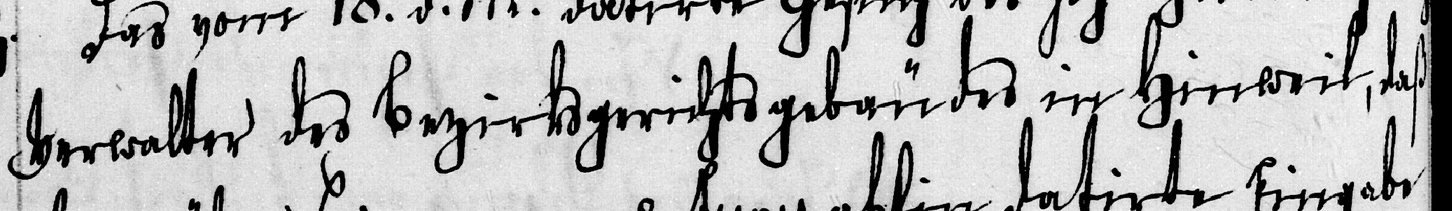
Verwalter des Bezirksgerichtsgebäudes in Hinweil, daß
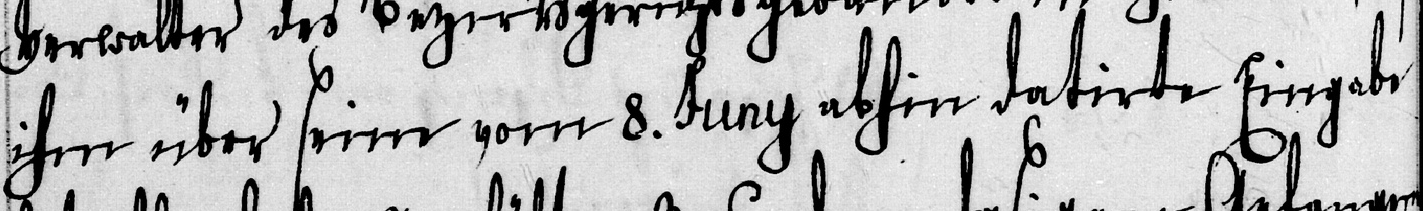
ihm über seine vom 8. Juny abhin datirte Eingabe
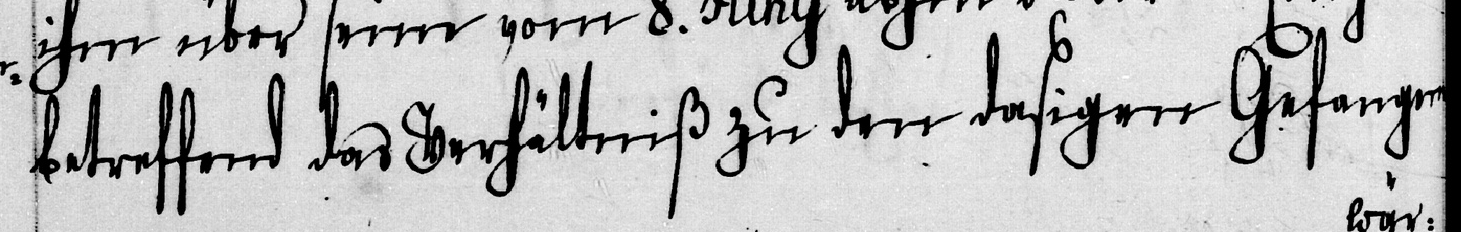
betreffend das Verhältniß zu den dasigen Gefange¬
